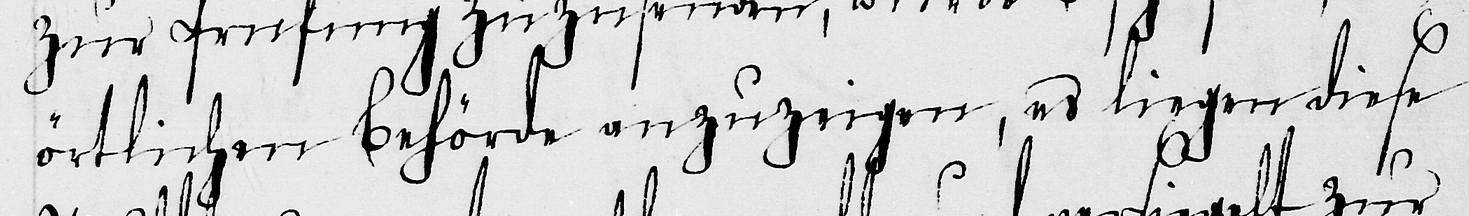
örtlichen Behörde anzuzeigen, es liegen diese
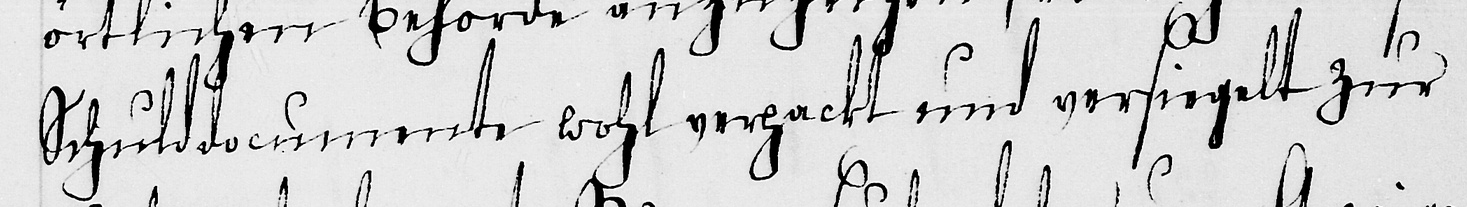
Schulddocumente wohl verpackt und versiegelt zur
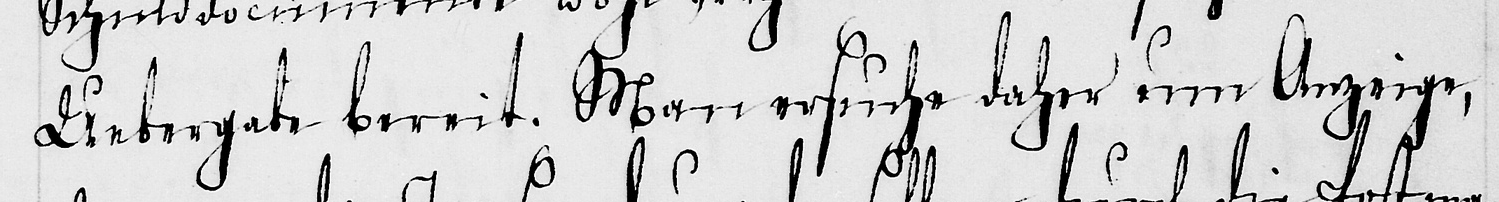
Uebergabe bereit. Man ersuche daher um Anzeige,
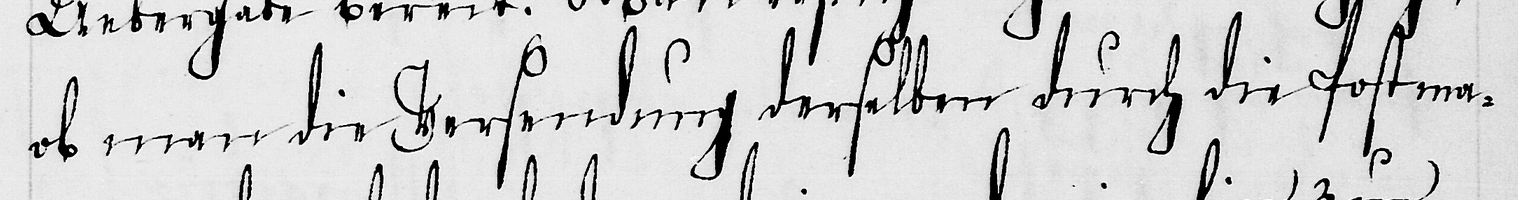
ob man die Versendung derselben durch die Post ma¬
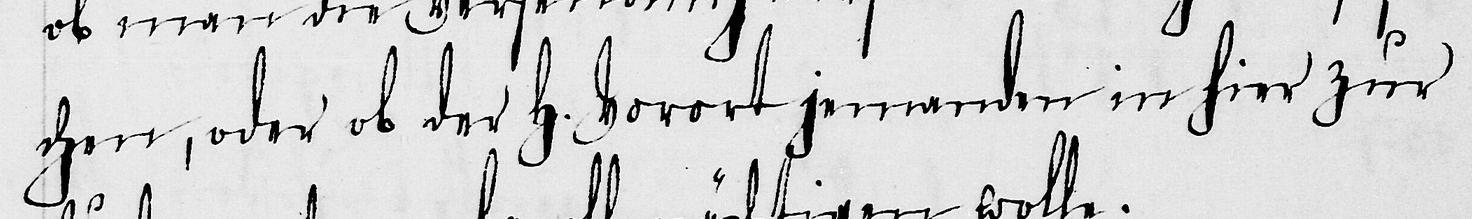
chen, oder ob der H. Vorort jemanden in hier zur
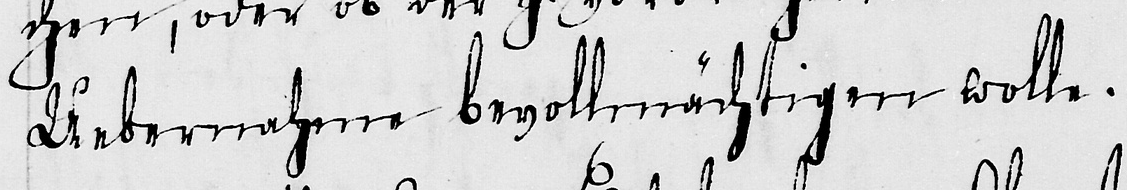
Uebrnahme bevollmächtigen wolle.
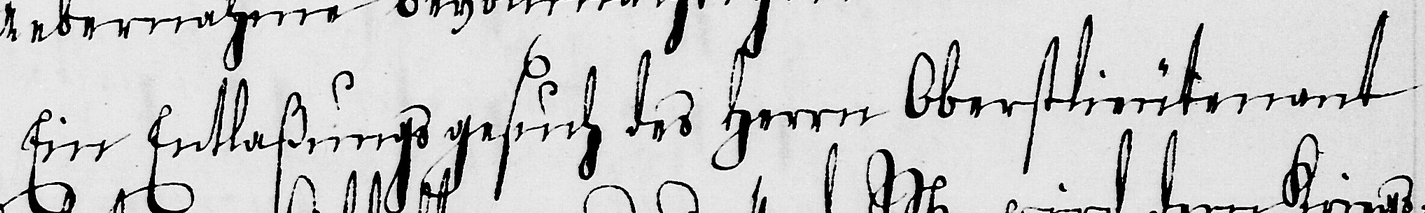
Ein Entlaßungsgesuch des Herrn Oberstlieutenant
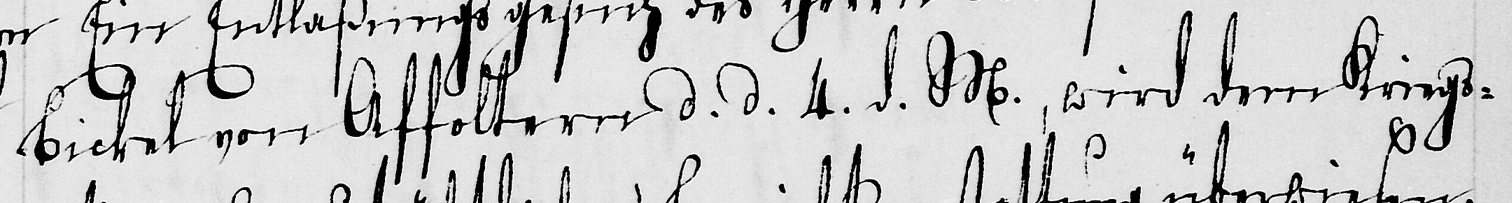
Bickel von Affoltern d. d. 4. d. M., wird dem Kriegs¬
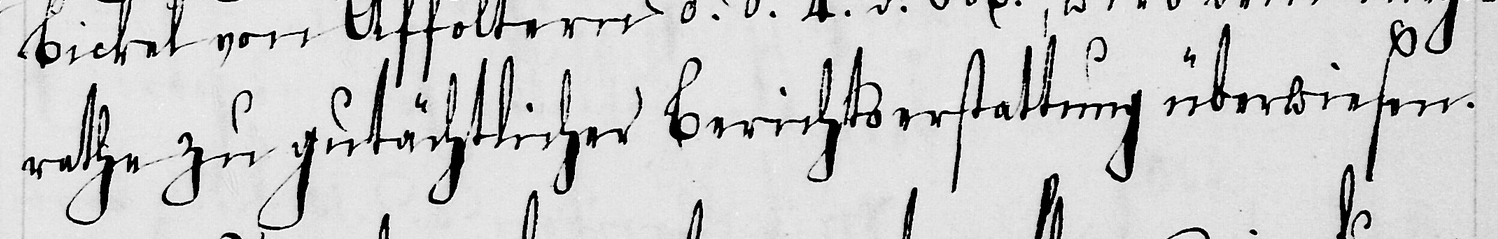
rathe zu gutächtlicher Berichterstattung überwiesen.
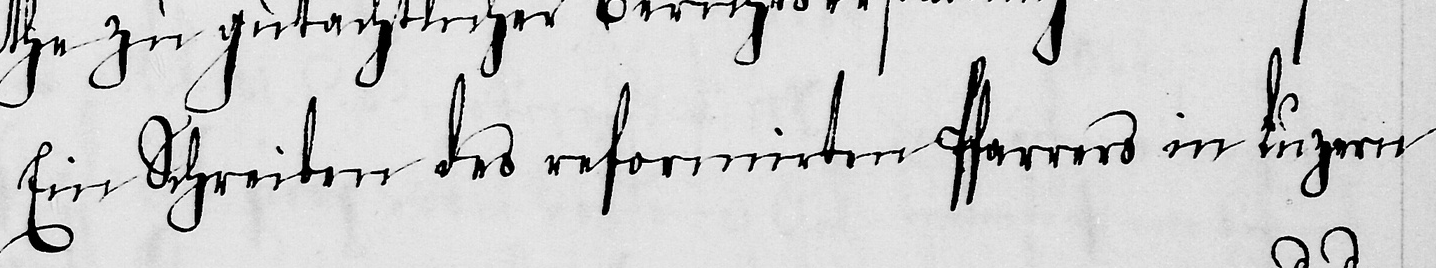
Ein Schreiben des reformirten Pfarrers in Luzern
